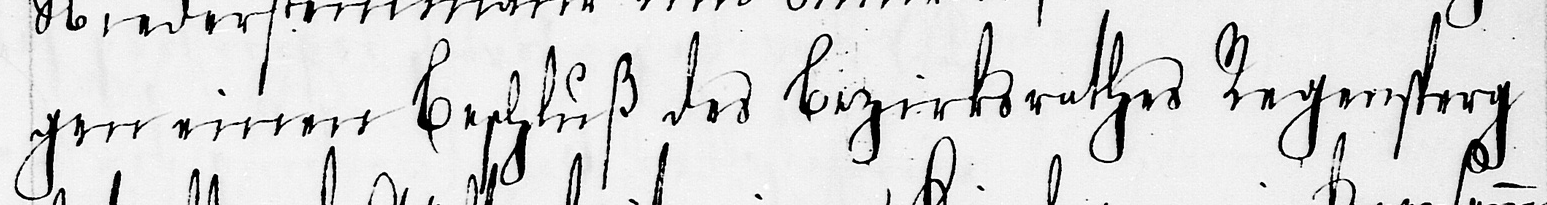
gen einen Beschluß des Bezirksrathes Regensperg
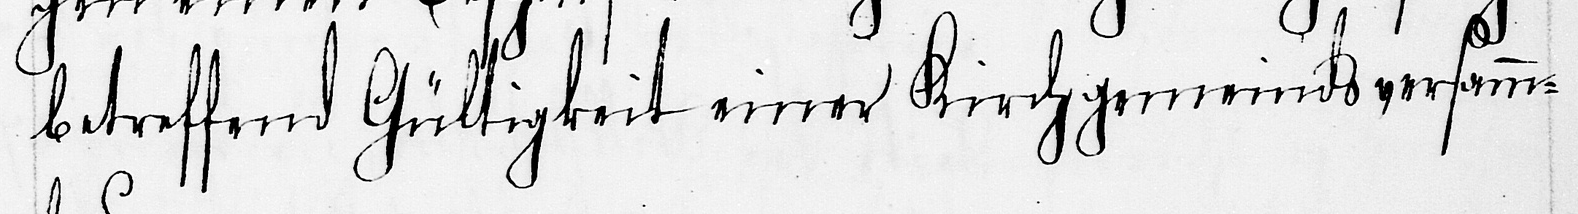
betreffend Gültigkeit einer Kirchgemeindsversamm¬
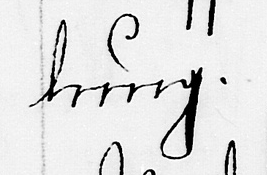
lung.
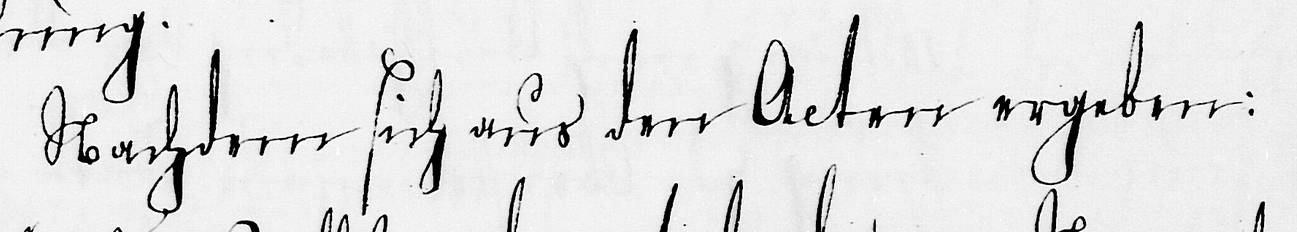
Nachdem sich aus den Acten ergeben:
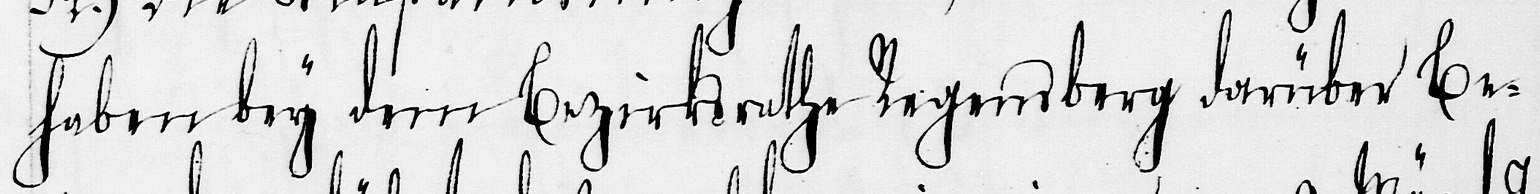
haben bey dem Bezirksrathe Regensberg darüber Be¬
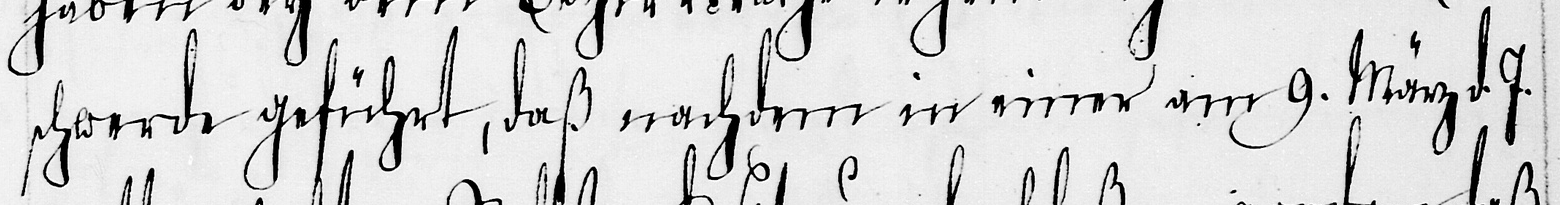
schwerde geführt, daß nachdem in einer am 9. März d. J.
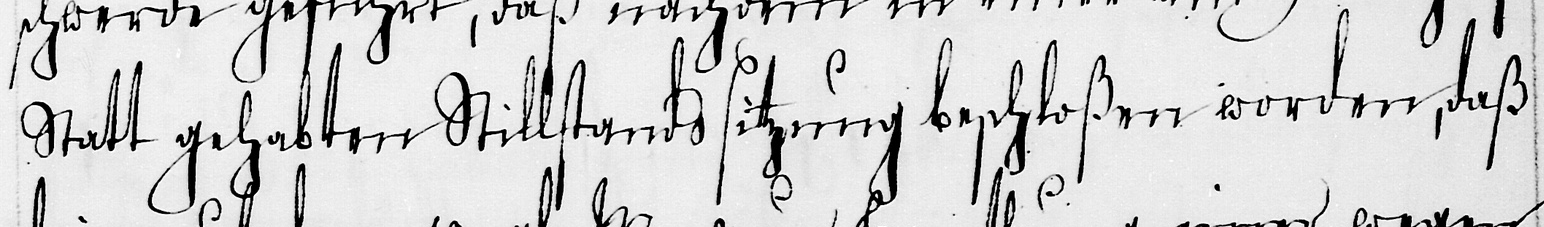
Statt gehabten Stillstandssitzung beschloßen worden, daß
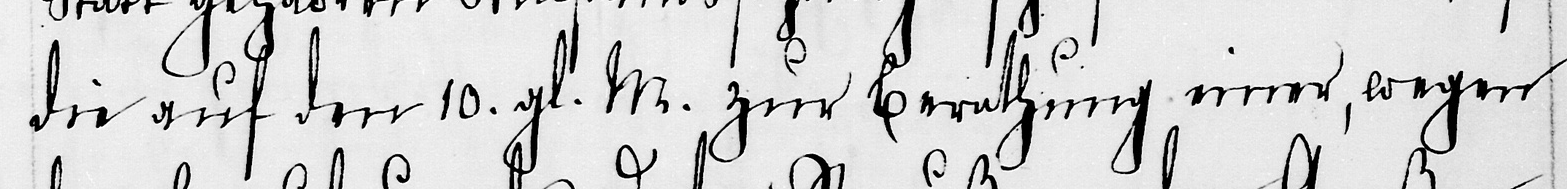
die auf den 10. gl. M. zur Berathung einer, wegen
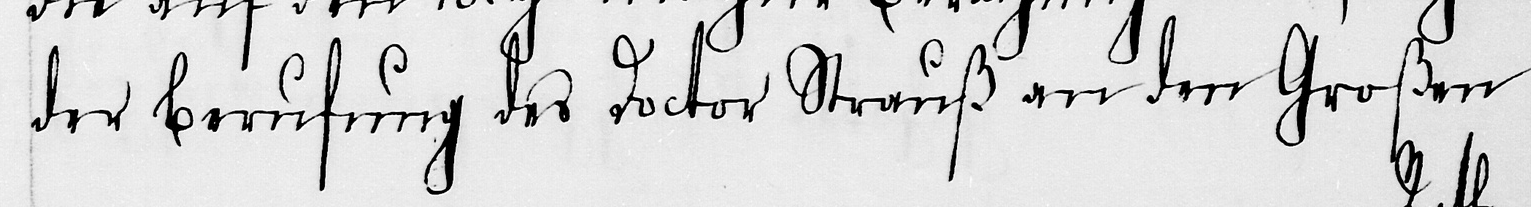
der Berufung des Doctor Strauß an den Großen
